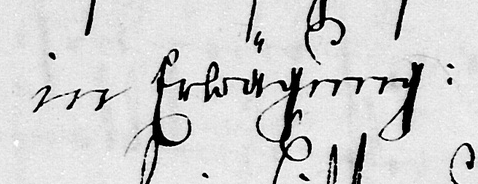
in Erwägung:
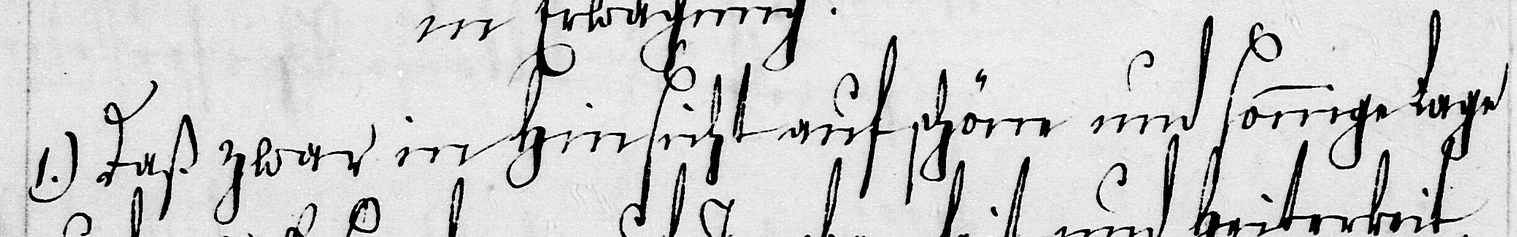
1.) Daß zwar in Hinsicht auf schöne und sonnige Lage
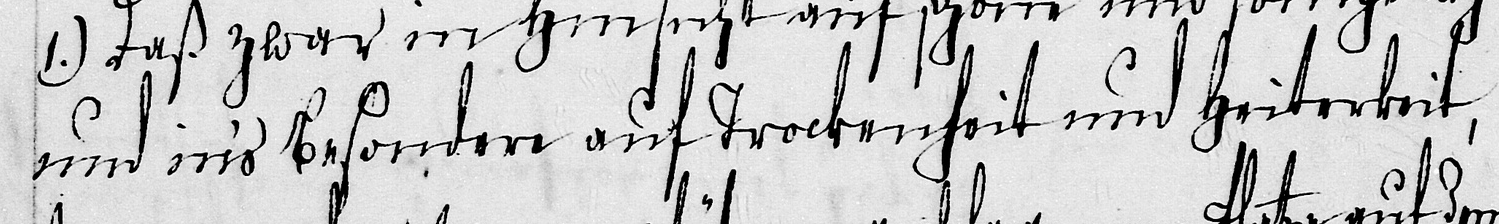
und in’s Besondere auf Trockenheit und Heiterkeit,
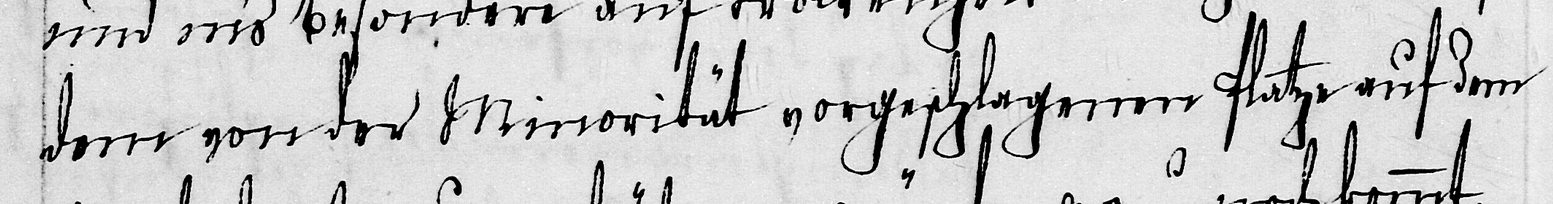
dem von der Minorität vorgeschlagenen Platze auf dem
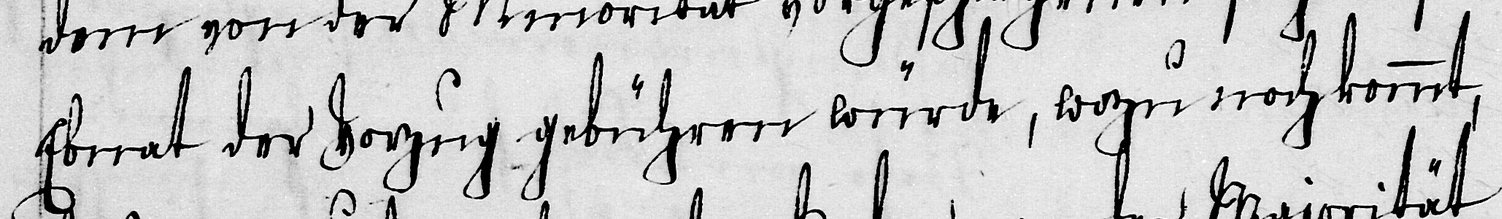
Ebnat der Vorzug gebühren würde, wozu noch kommt,
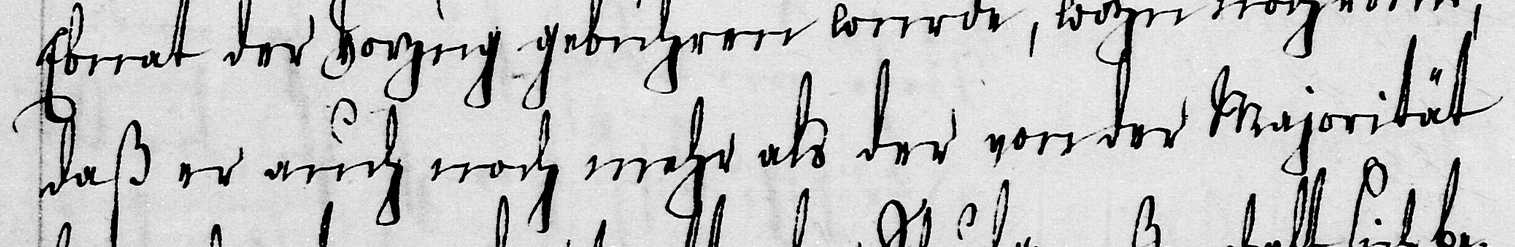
daß er auch noch mehr als der von der Majorität
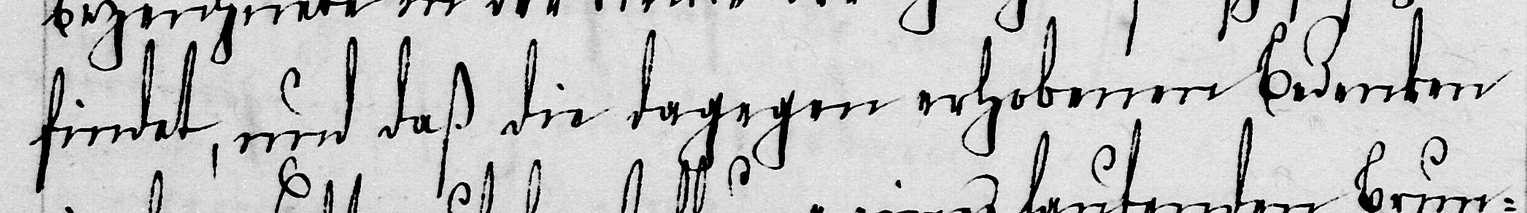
findet, und daß die dagegen erhobenen Bedenken
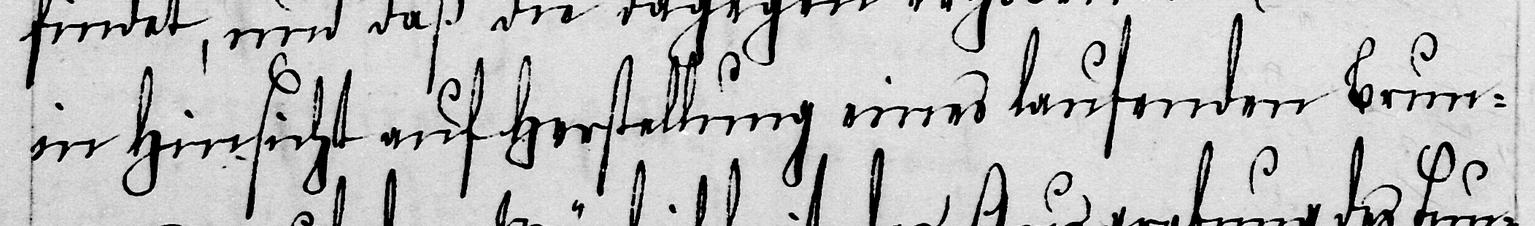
in Hinsicht auf Herstellung eines laufenden Brun¬
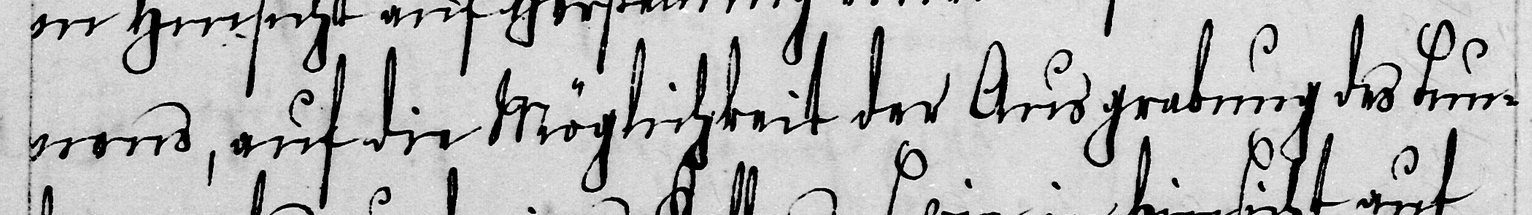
nens, auf die Möglichkeit der Ausgrabung des Fun¬
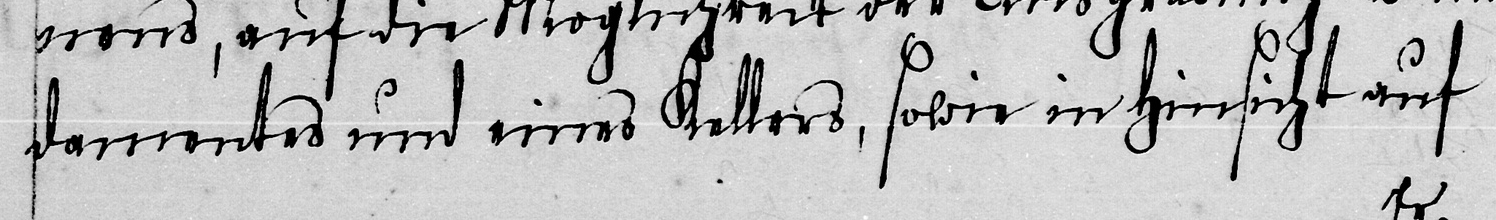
damentes und eines Kellers, sowie in Hinsicht auf
